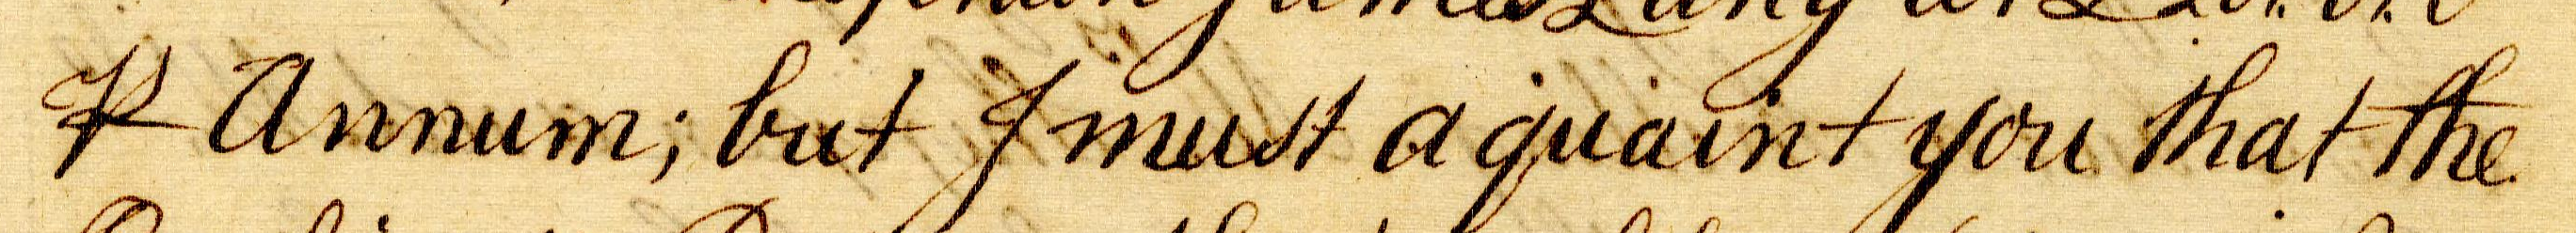per Annum; but I must aquaint you that the
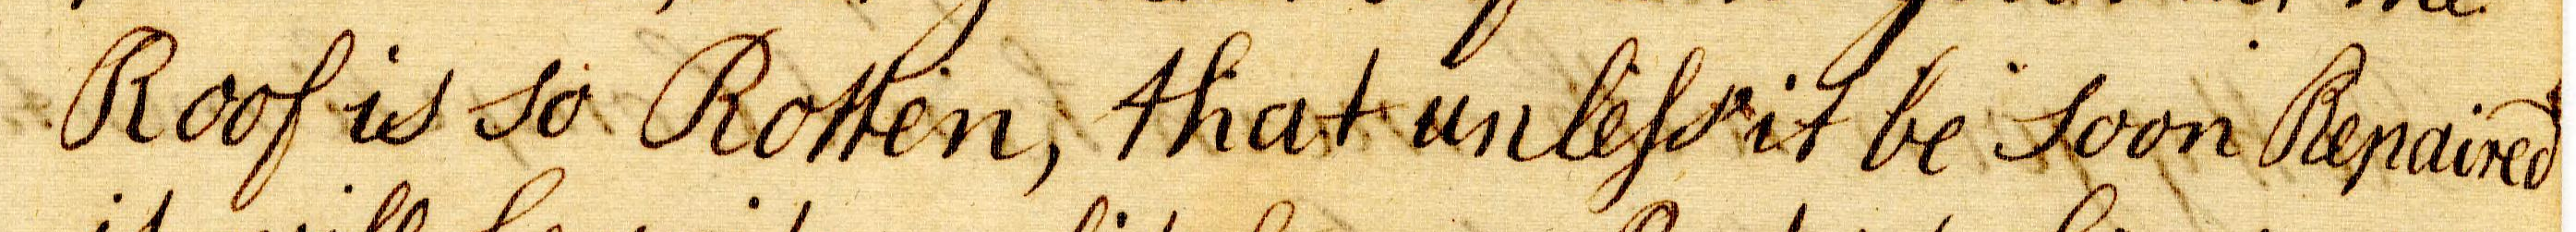Roof is so Rotten, that unless it be soon Repaired
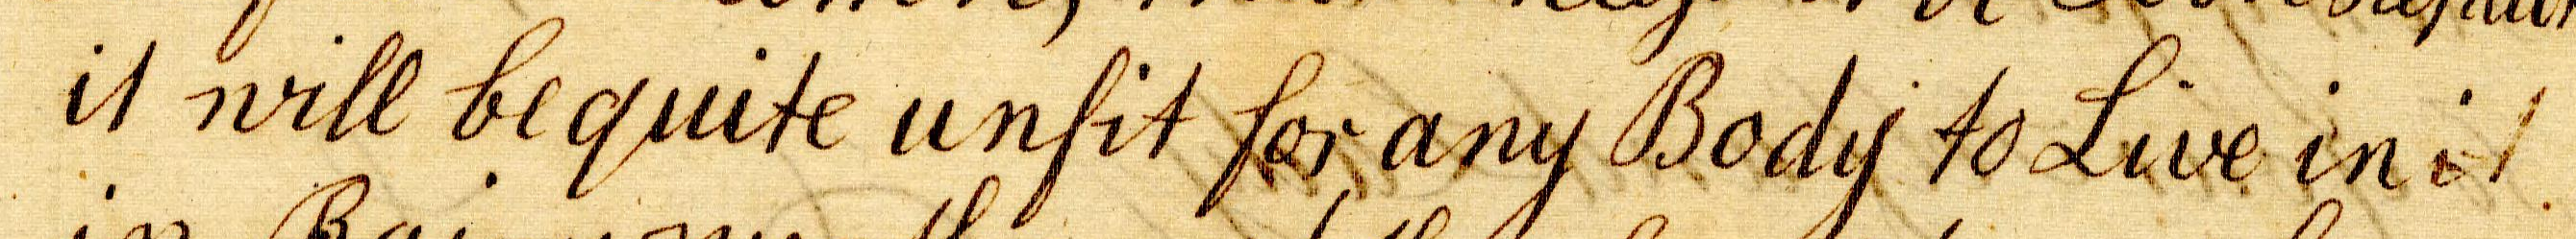it will be quite unfit for any Body to Live in it
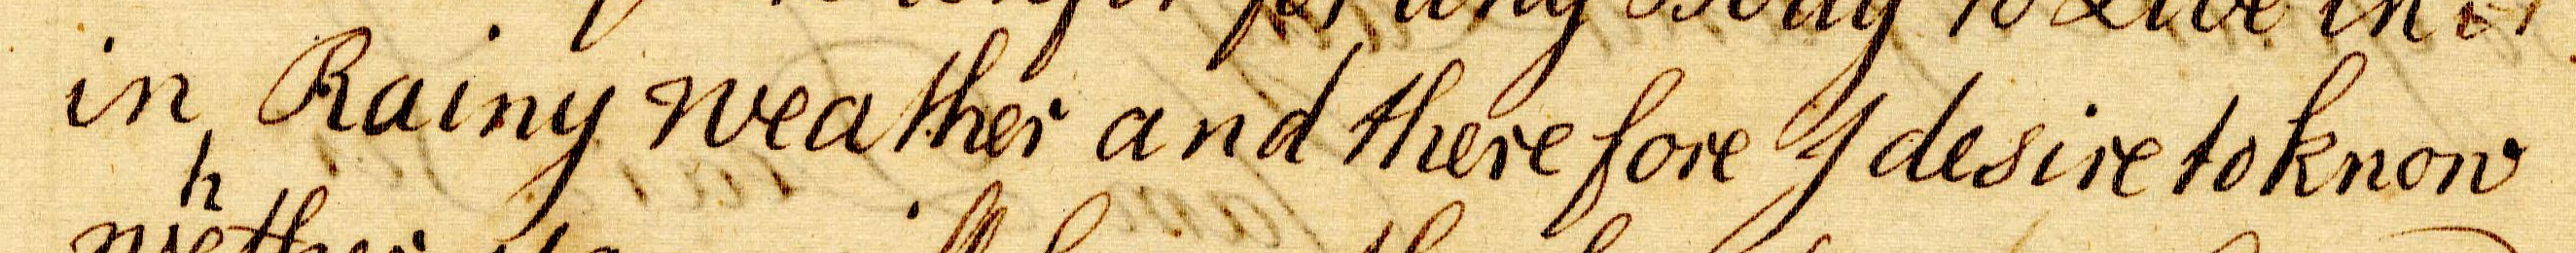in Rainy weather and therefore I desire to know
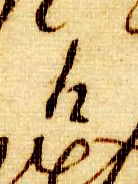h
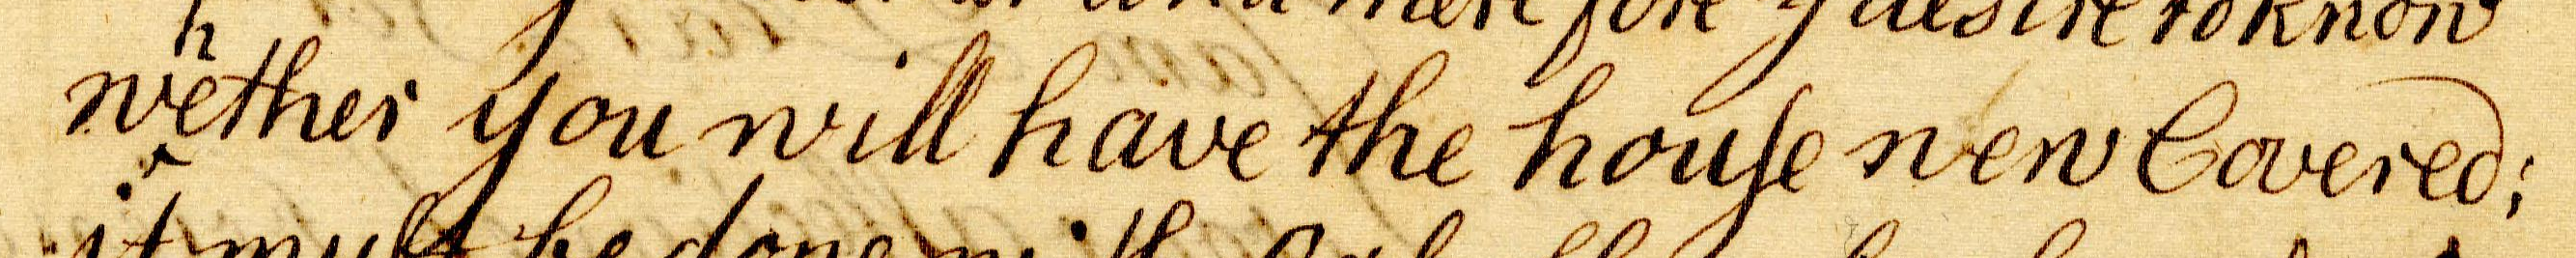w^ether You will have the house nen Covered;
